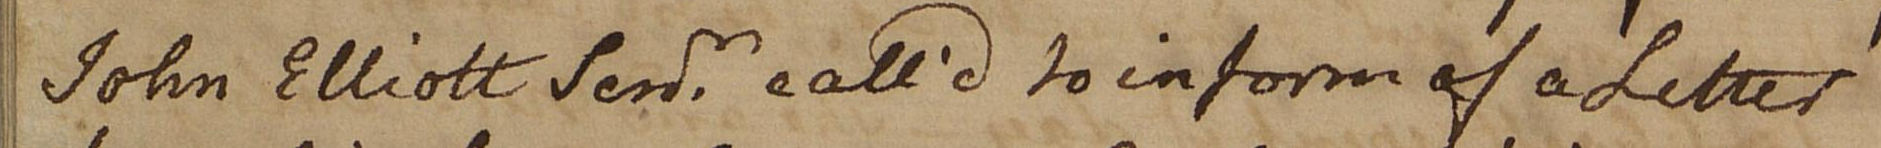John Elliott Sen^r. call'd to inform of a Letter
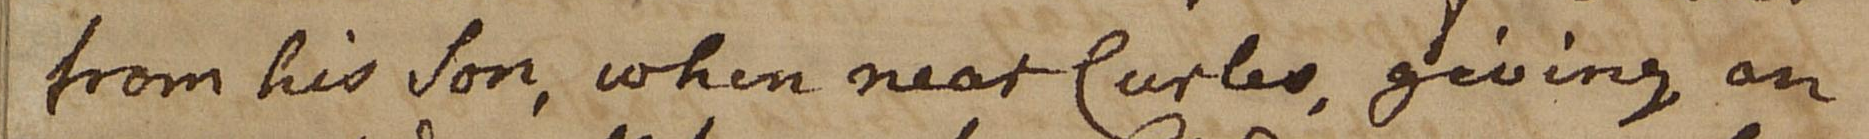from his Son, when neat Curles, giving an
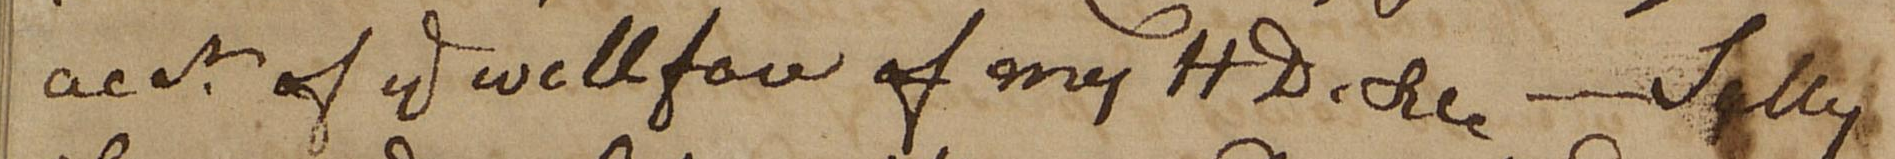acc^t. of y^e wellfare of my HD. &c- Sally
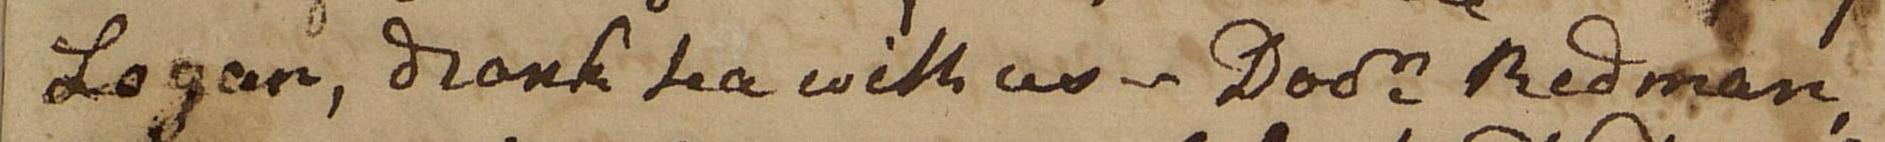Logan, drank tea with us- Doc^r. Redman,
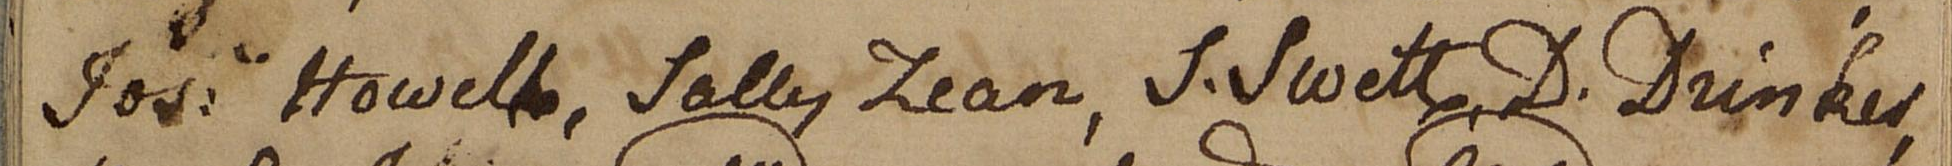Jos^s: Howell, Sally Zean, S. Swett, D. Drinker,
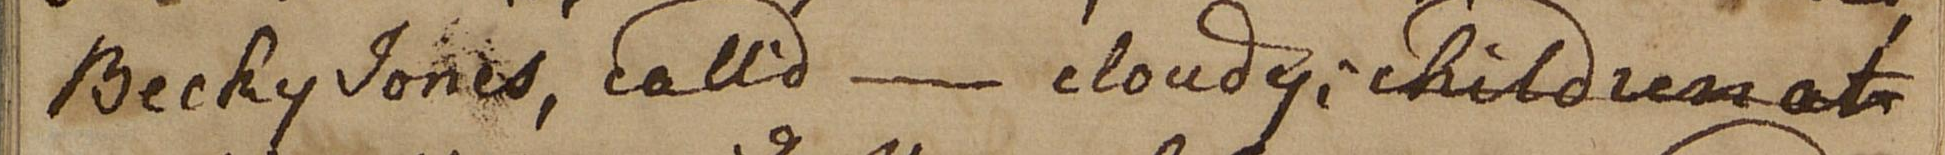Becky Jones, call'd- cloudy; children at
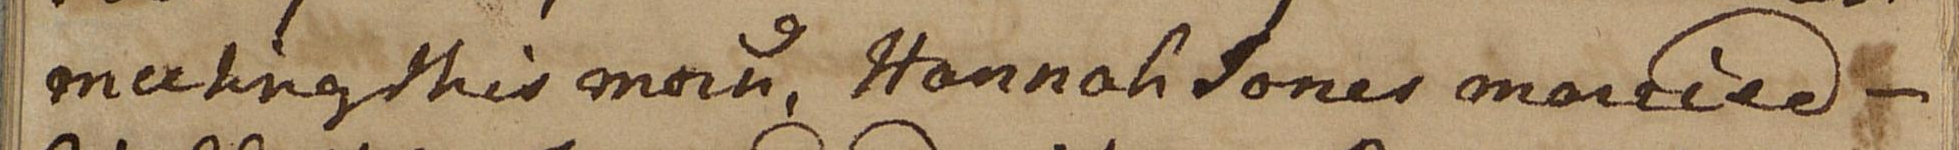meeting this morn^g, Hannah Jones married-
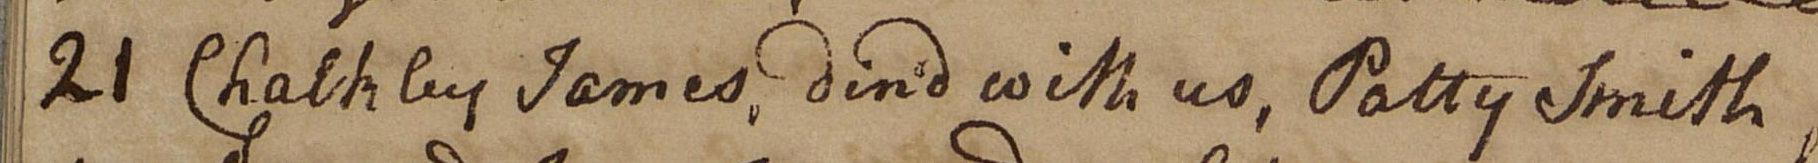21 Chalkley James, din'd with us, Patty Smith,
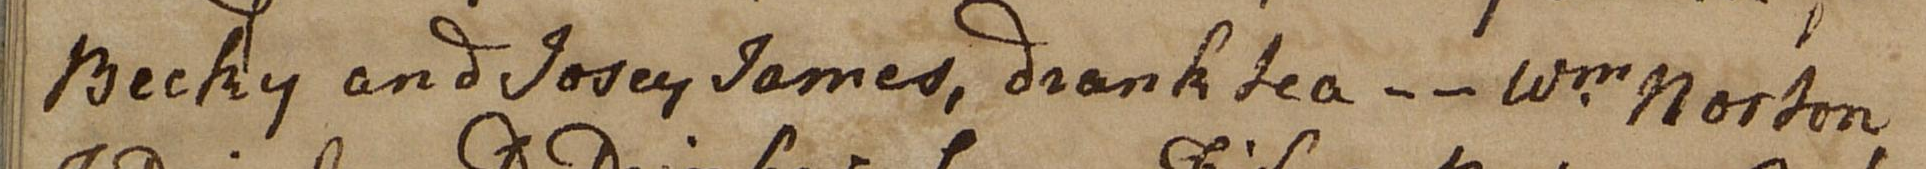Becky and Josey James, drank tea-- W^m. Norton,
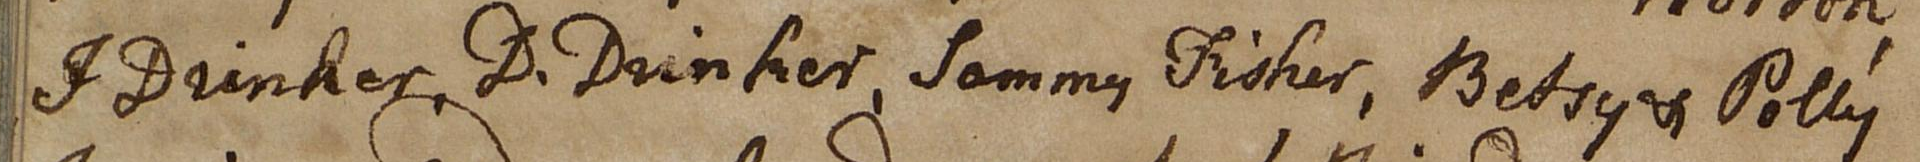I Drinker, D. Drinker, Sammy Fisher, Betsy & Polly
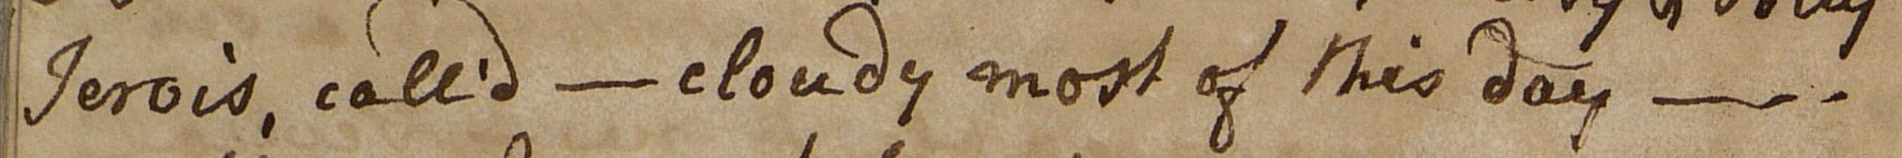Jervis, call'd- cloudy most of this day-
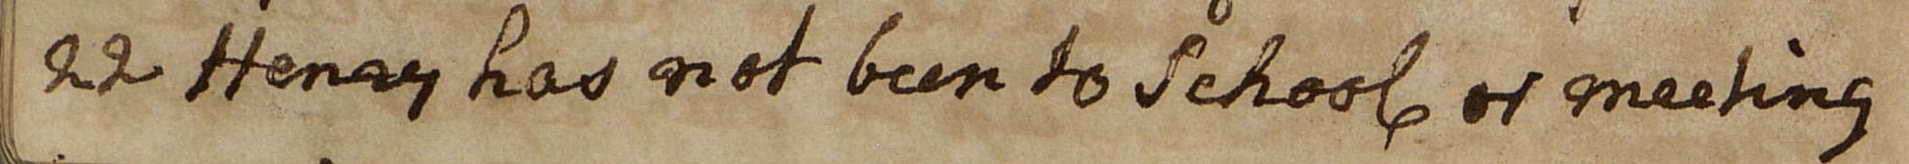22 Henry has not been to School or meeting
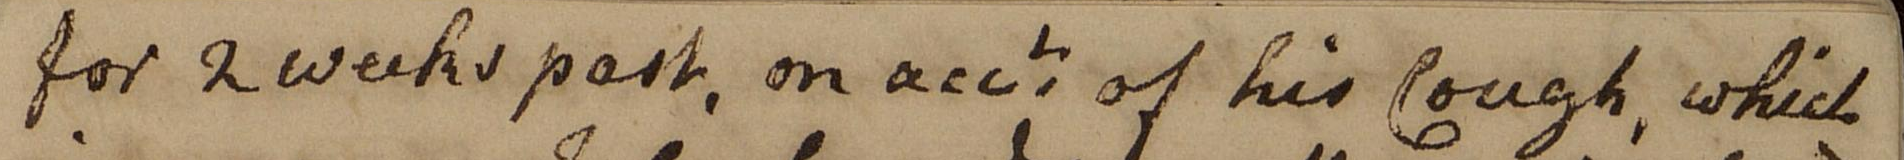for 2 weeks past, on acc^t. of his Cough, which
